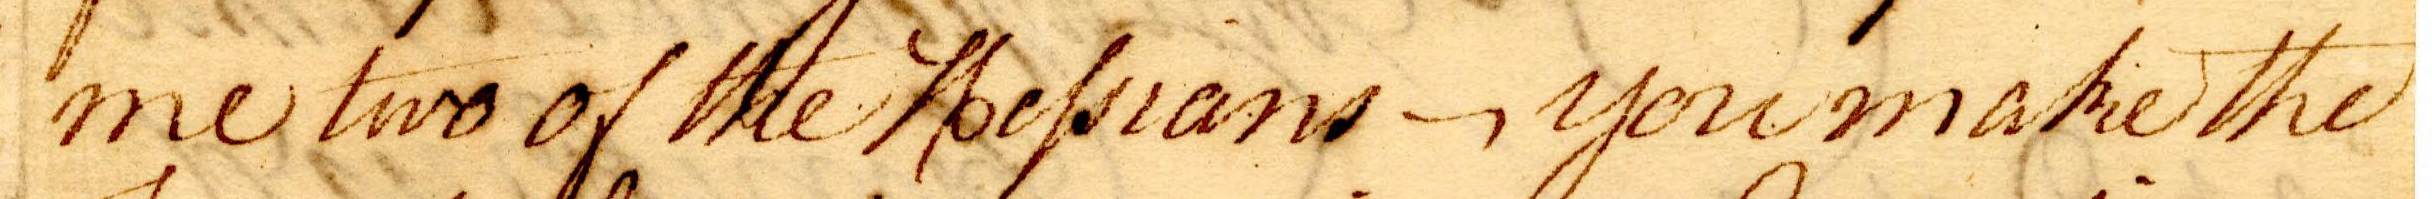me two of the Hessians- You make the
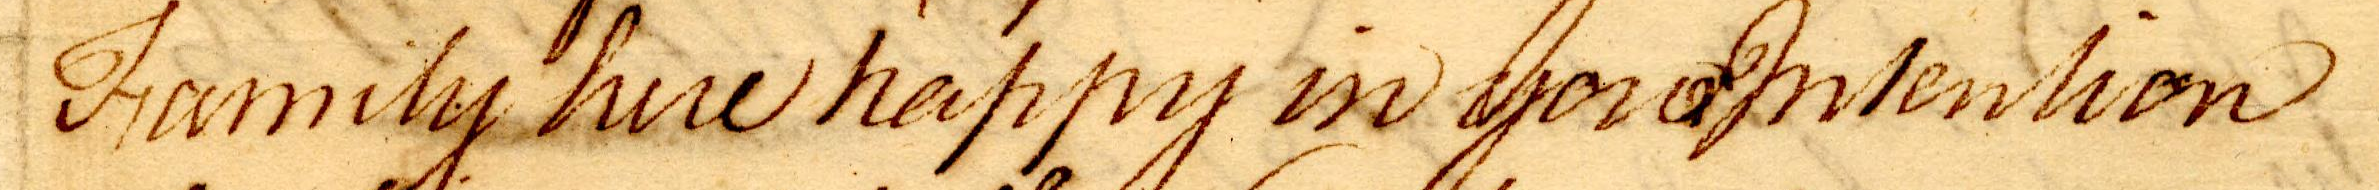Family here happy in yor Intention
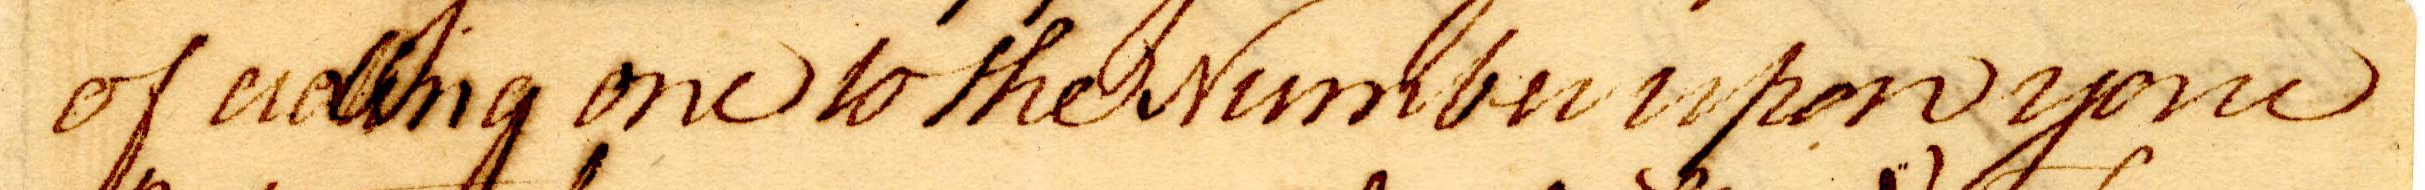of ading one to the Number upon your
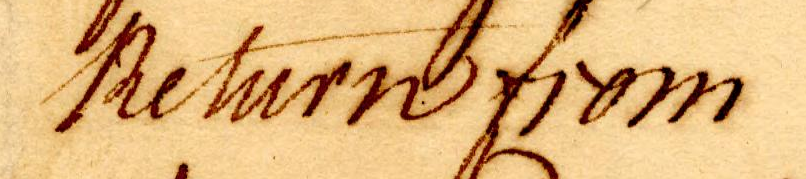Return from
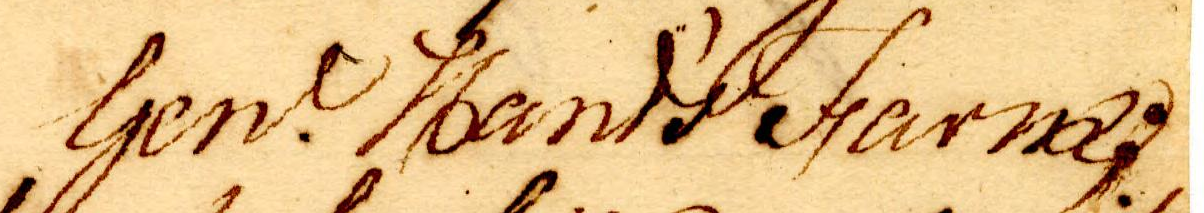Gen^l. Han^l's Farm:
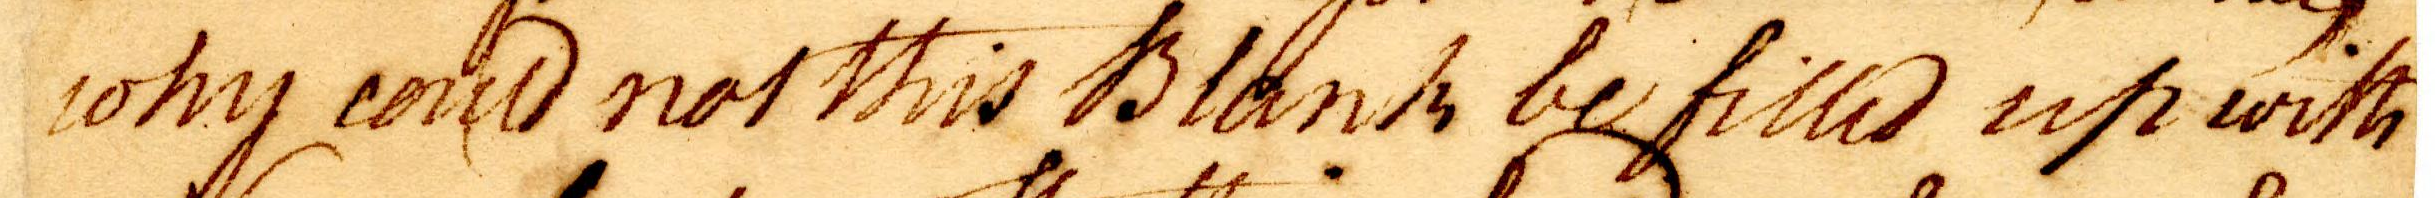why could not this Blank be filled up with
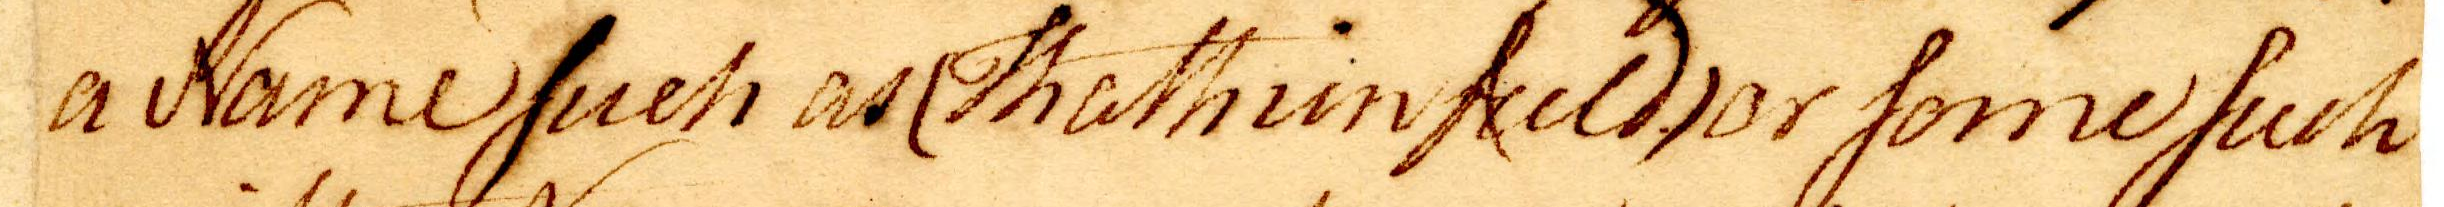a Name such as (Thathinfeld) or some such
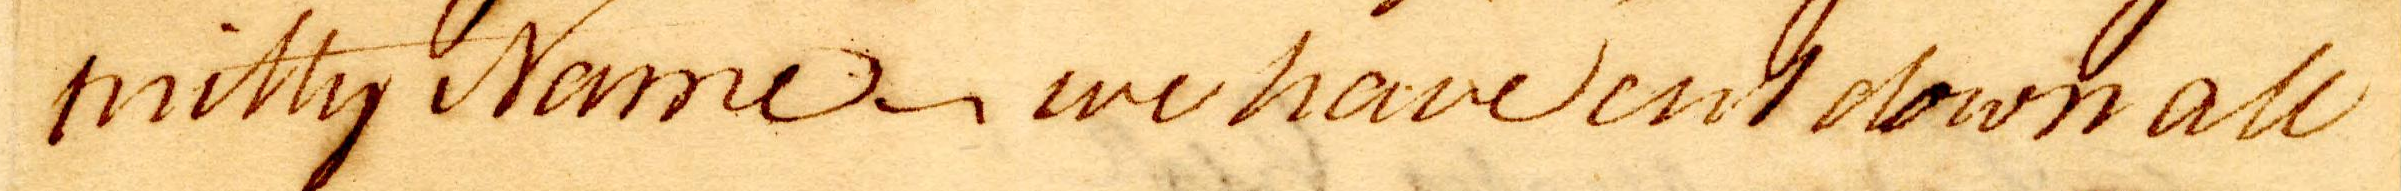mitty Name.- we have sent down all
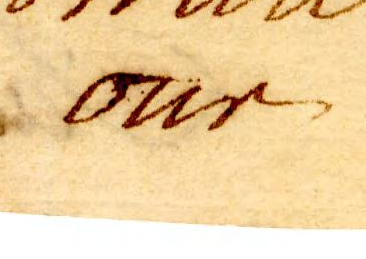our
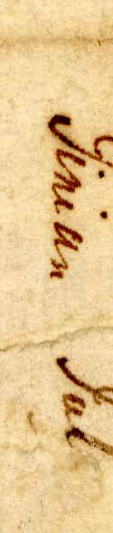Tinian Jul
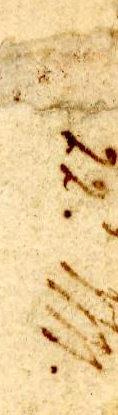22^d. 1777.
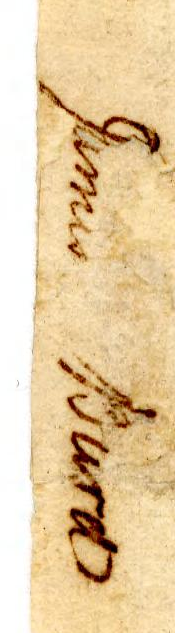James Burd
